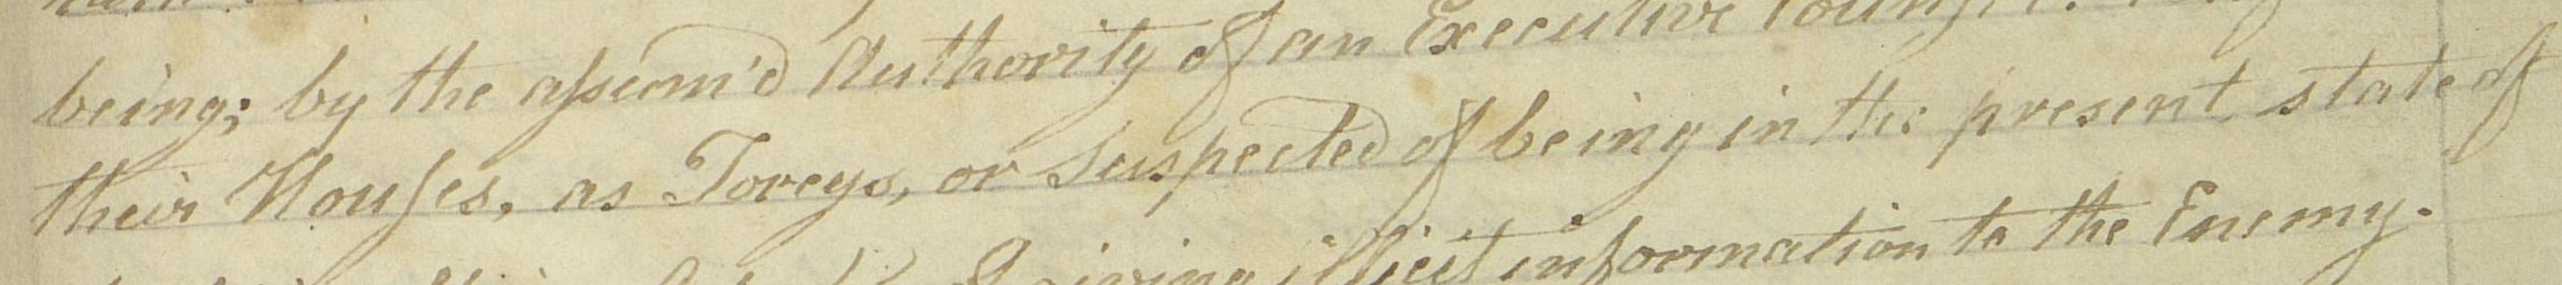their Houses, as Toreys, or Suspected of being in the present state of
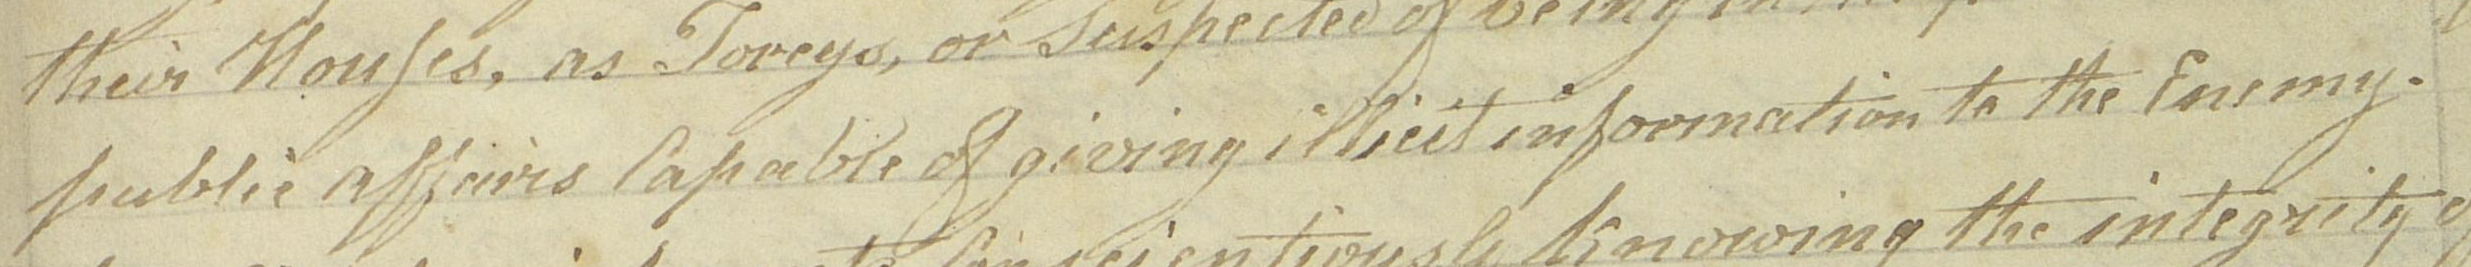public affairs Capable of giving illicit information to the Enemy.
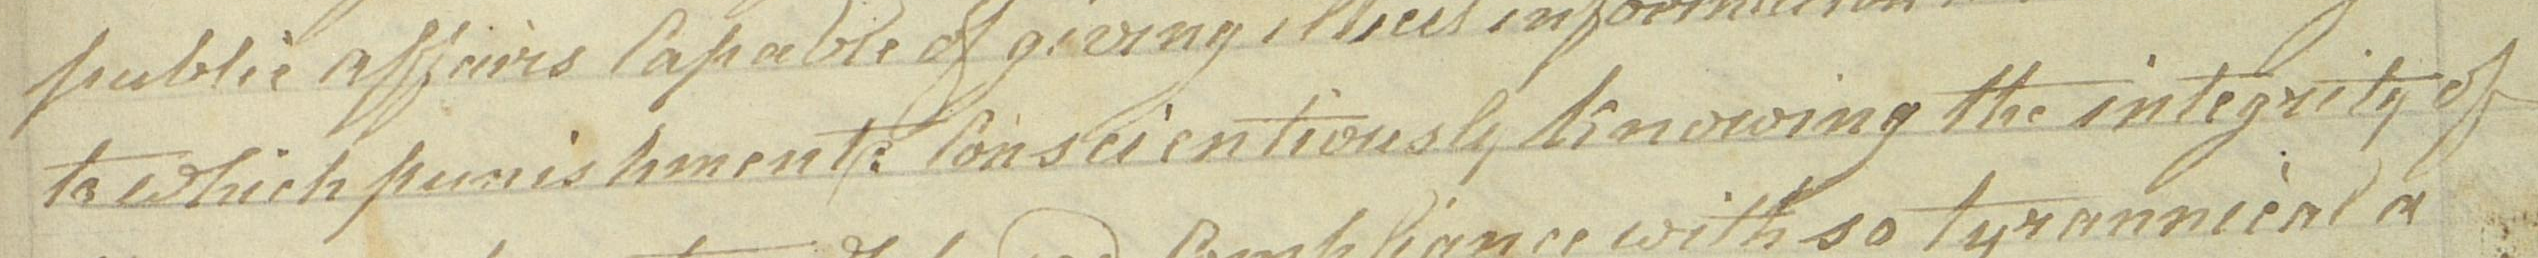to which punishment: Conscientiously knowing the integrity of
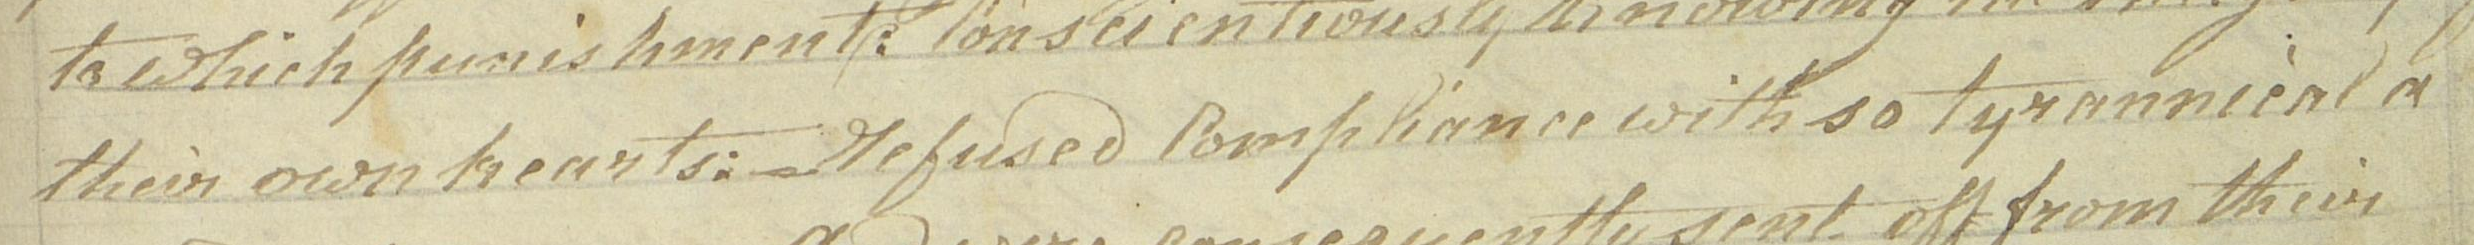their own hearts: refused Compliance with so tyrannical a
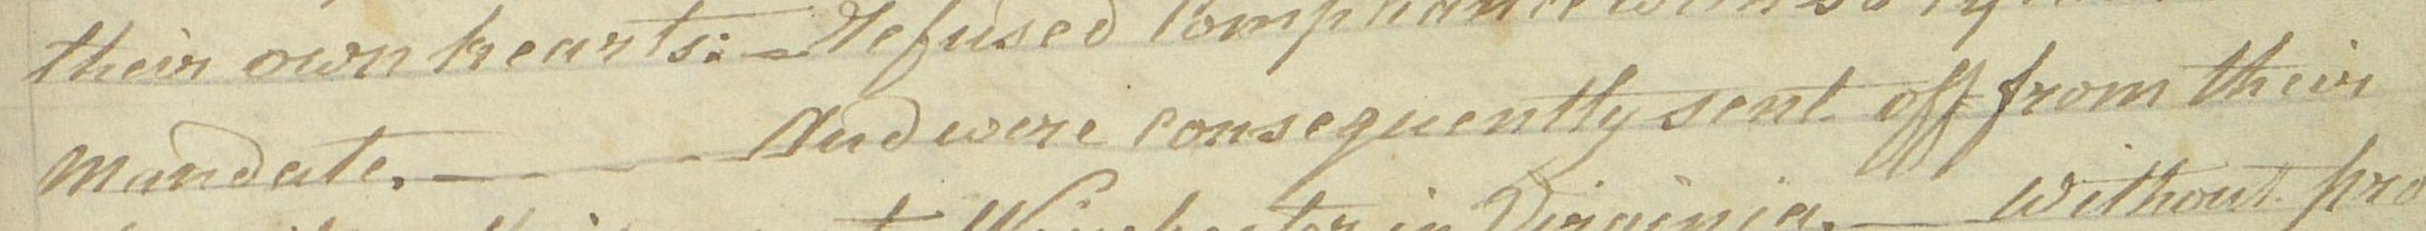Mandate. And were consequently sent off from their
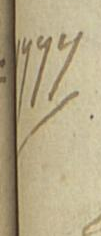1777
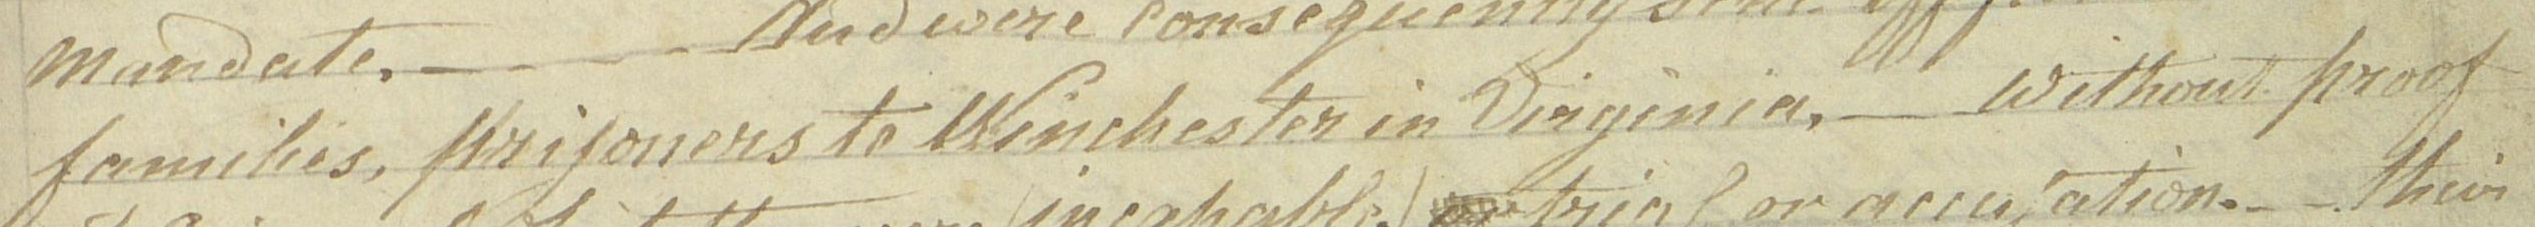families, prisoners to Winchester in Virginia. Without proof
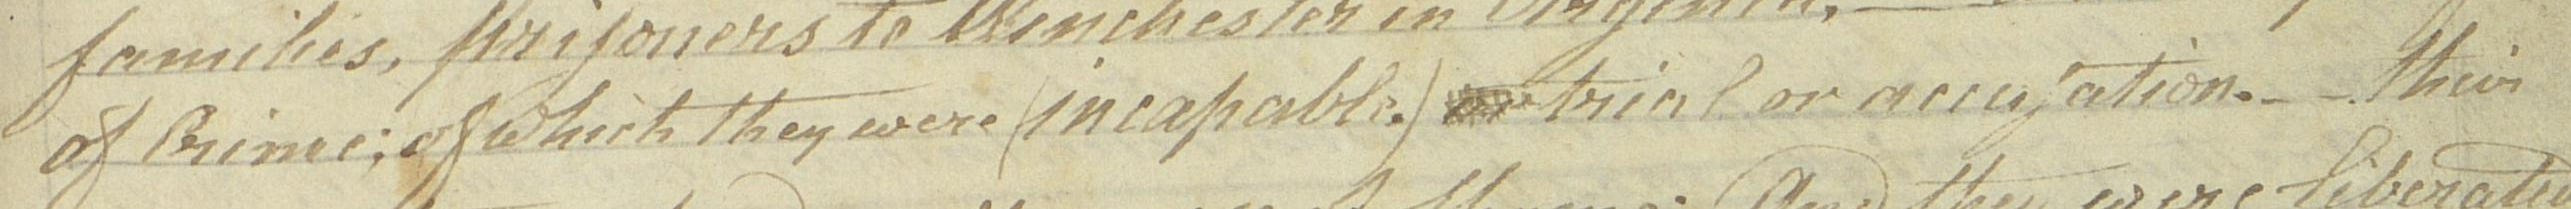of Crime; of which they were (incapable.) [or] trial or accusation. their
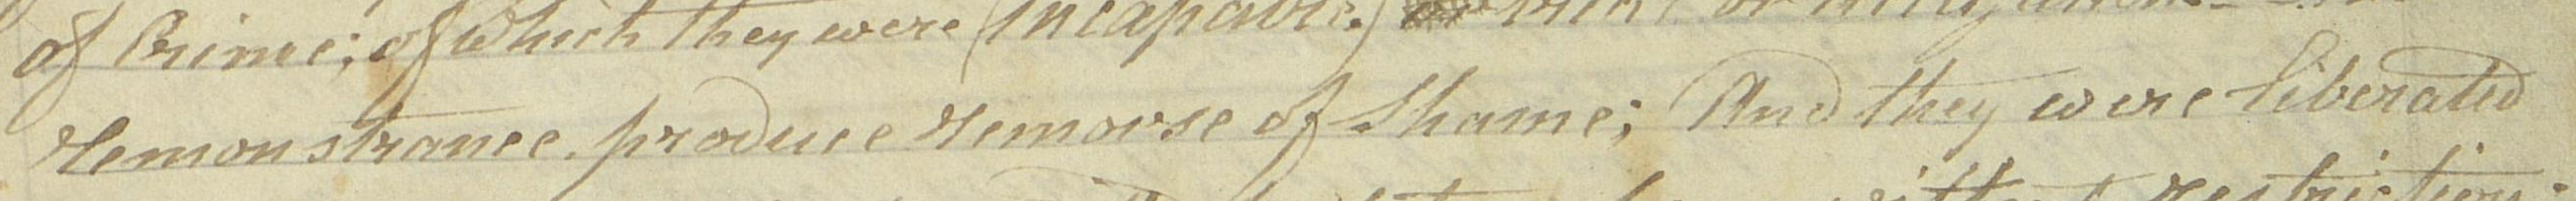remonstrance produce remorse of Shame; And they were liberated
